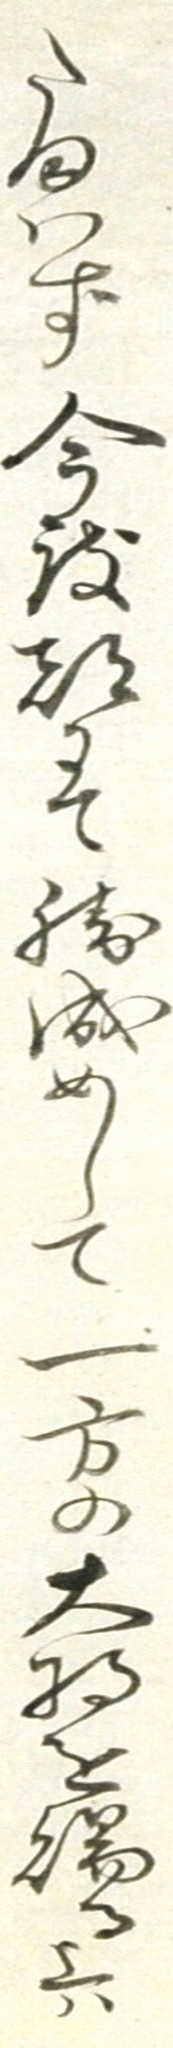たまはず今度都にて勝成めして一方の大将を賜る上は
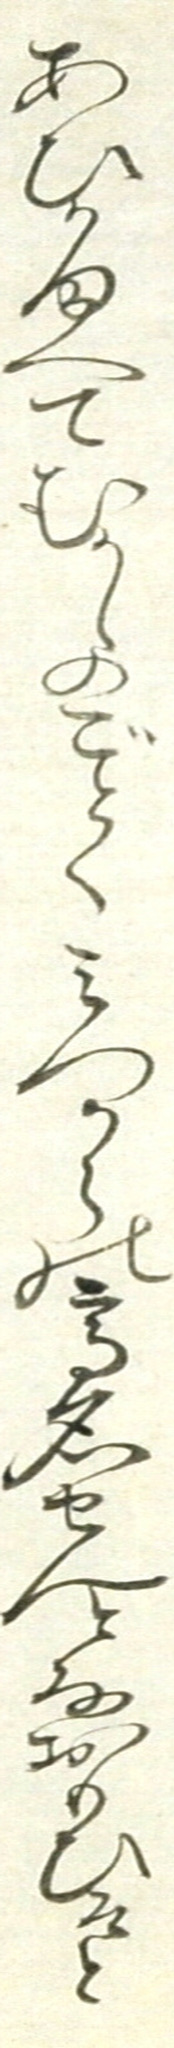あひかまへてむかしのごとくみつからの高名せんとなおもひそと
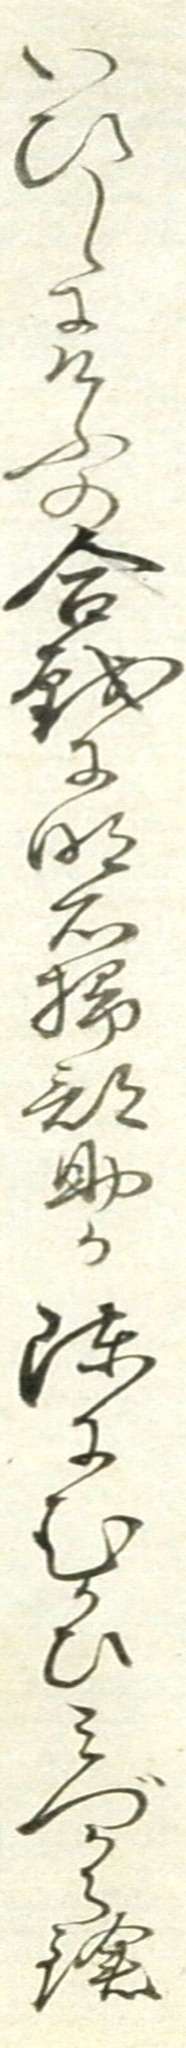いひしにけふの合戦に明石掃部助か陣にむかひみづから鎗
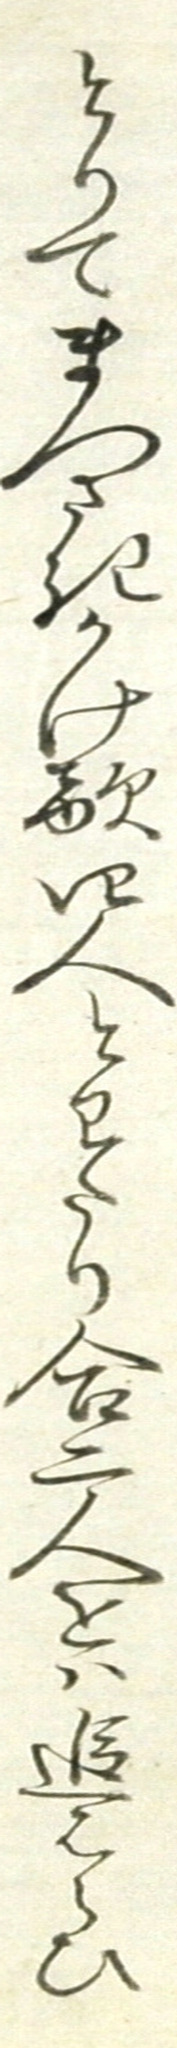とりてまつさきかけ敵四人とわたり合二人をは追はらひ
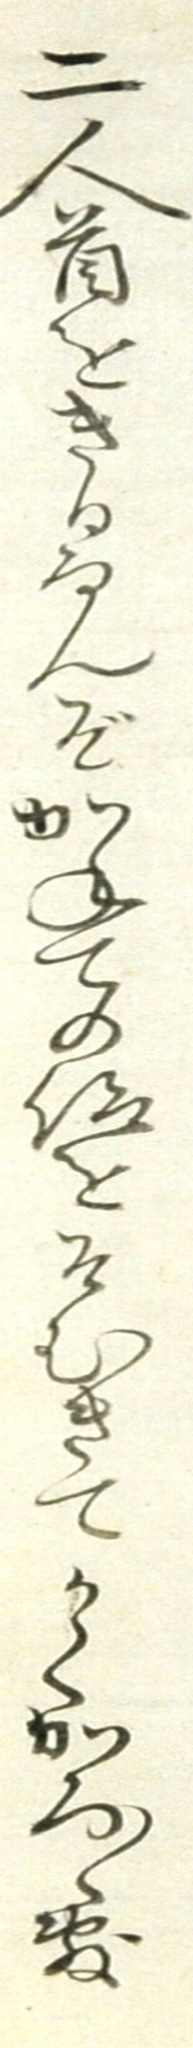二人首をきるなんぞかねての仰をそむきてかくかろ〳〵敷
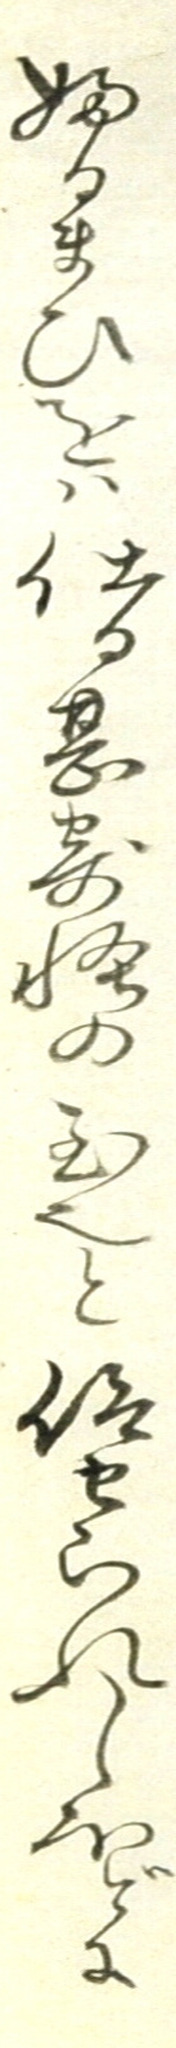ふるまひをは仕る甚奇怪の至也と仰せられしほどに

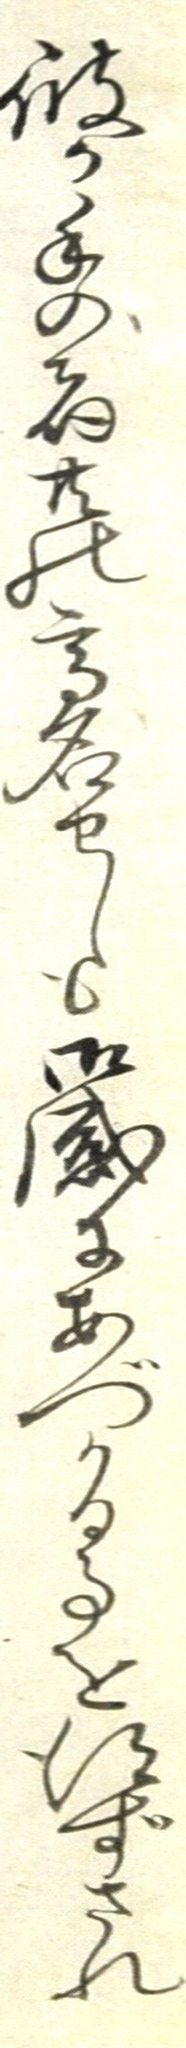彼か手の者共の高名せしも御感にあづかる事を得ずされ
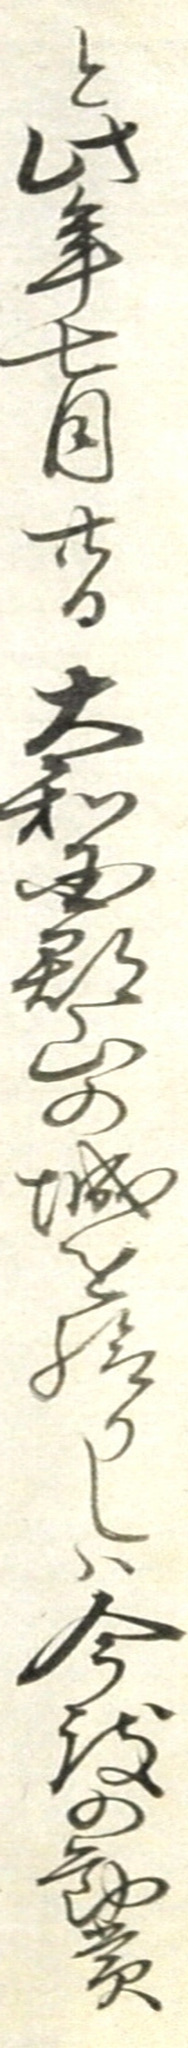と此年七月廿日大和国郡山の城を給りしは今度の勘賞
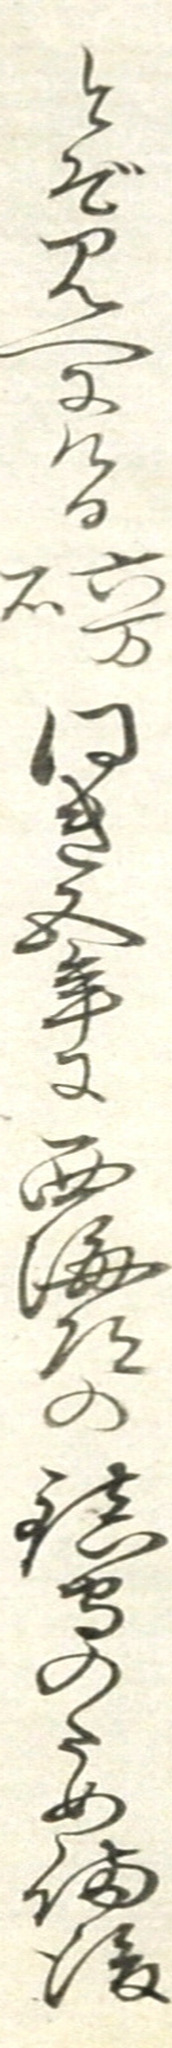とぞ見へにける六万石同き五年に西海道の鎮守のため備後
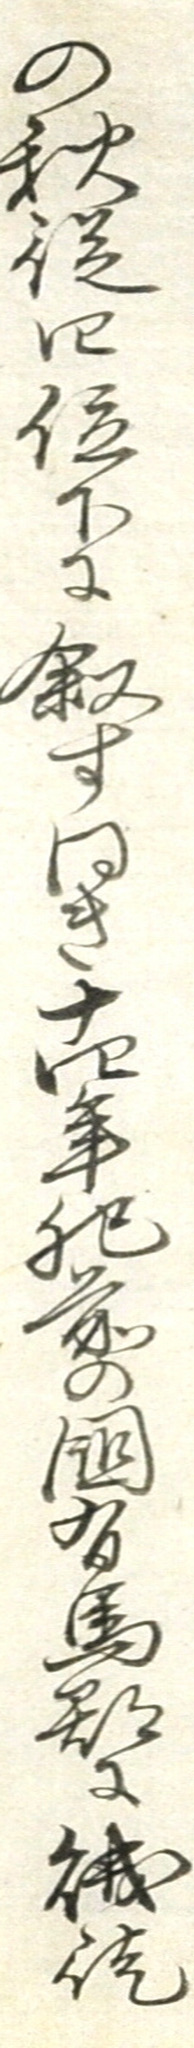の秋従四位下に叙す同き十四年肥前の国有馬郡に賊徒
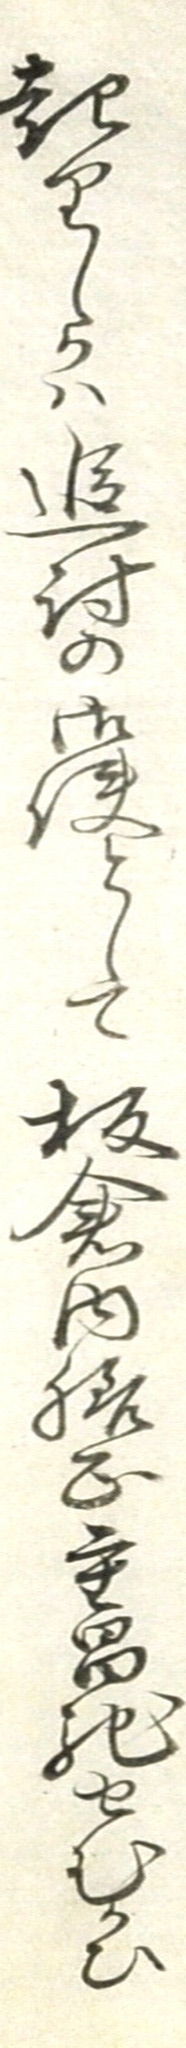起りしかは追討の御使として板倉内膳正重昌馳せむかひ
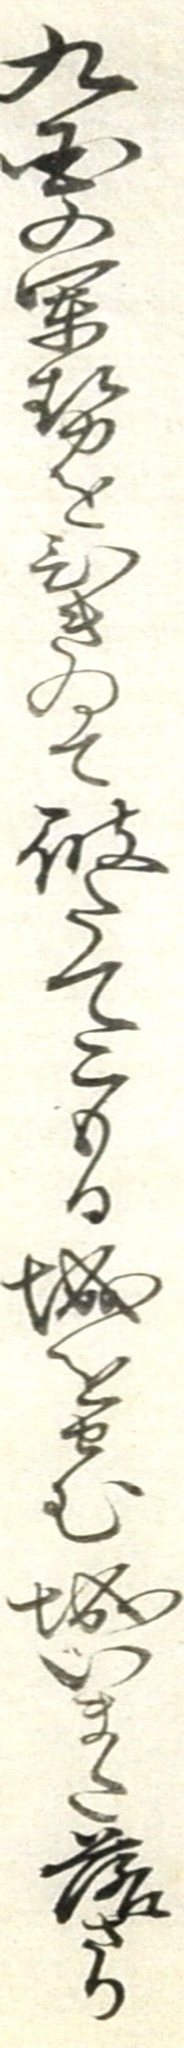九国の軍勢をひきゐて彼たてこもる城をせむ城いまた落さり
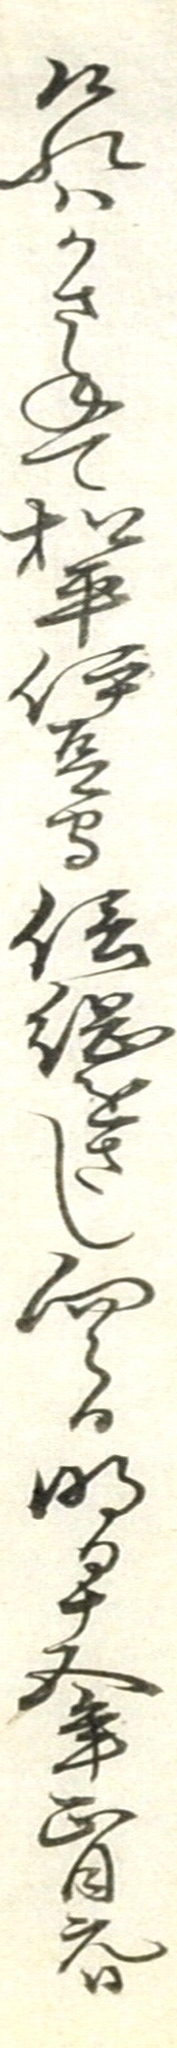けれはかさねて松平伊豆守信綱をさし向らる明る十五年正月元日
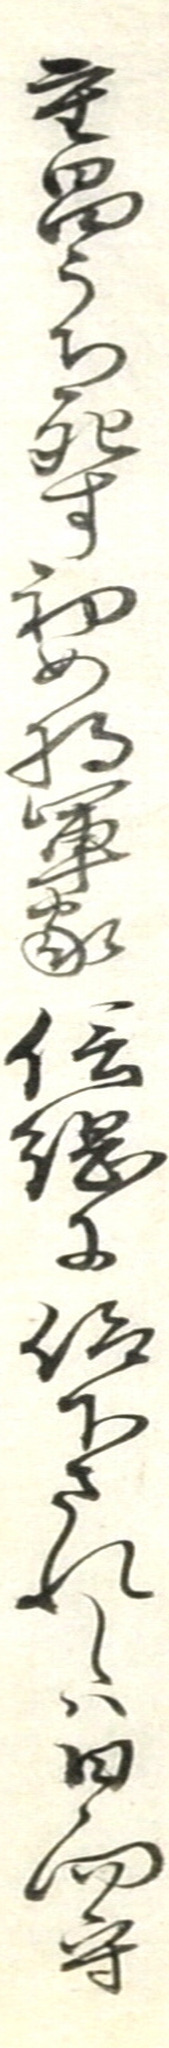重昌うち死す初め将軍家信綱に仰下されしは日向守
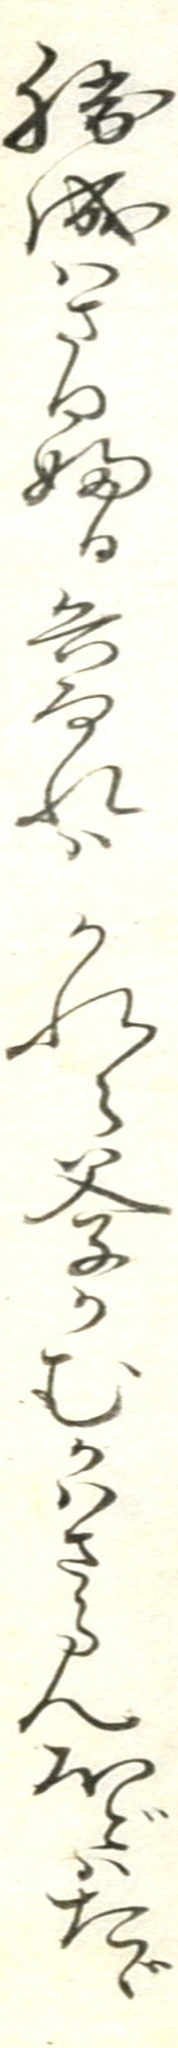勝成はさるふる兵なれはかれら父子かむかはさらんほどはたゞ
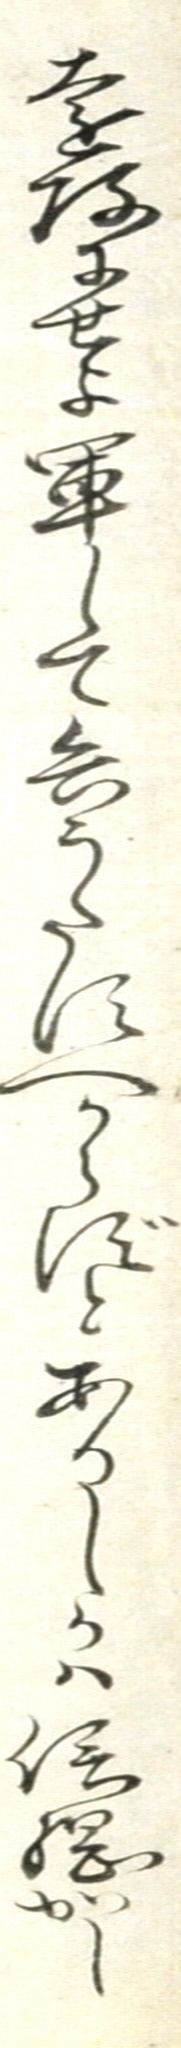遠攻にせよ軍して兵うたすへからずとありしかは信綱かし
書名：藩翰譜（二・三）
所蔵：伊那市立高遠町図書館・合同会社AMANE
